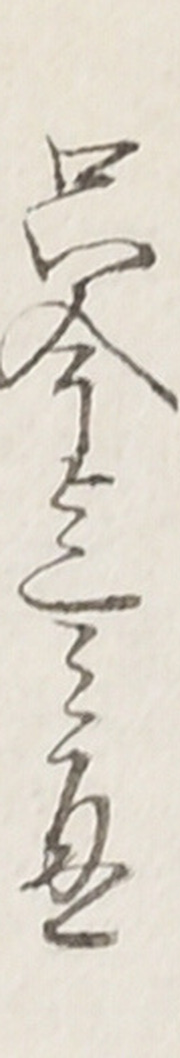只今迄之通
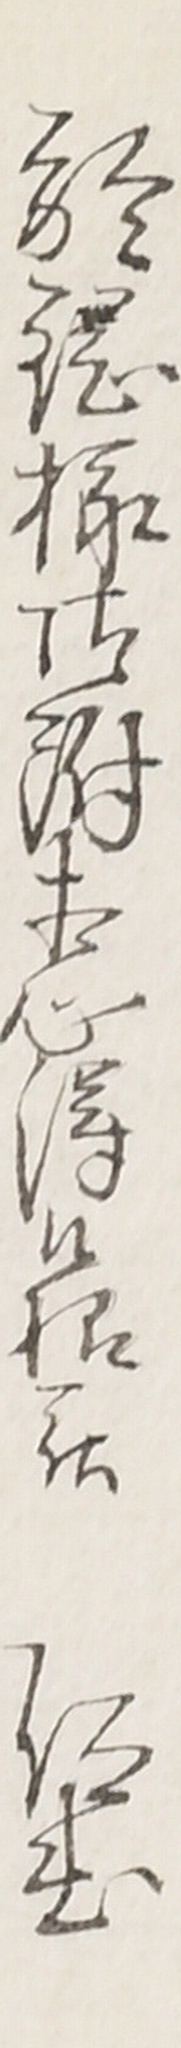於鋼様御附相心得候様被仰出
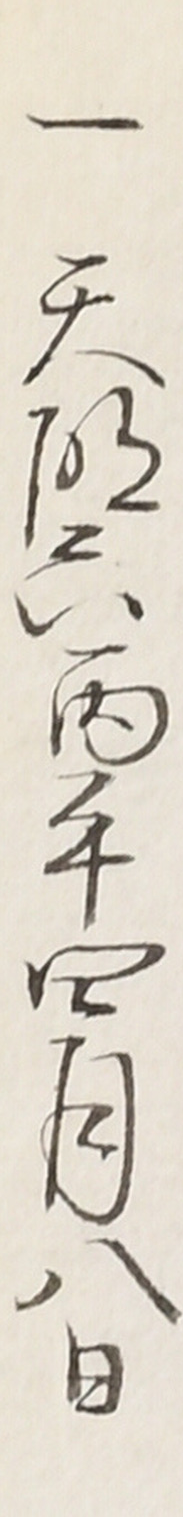一天明六丙午四月八日
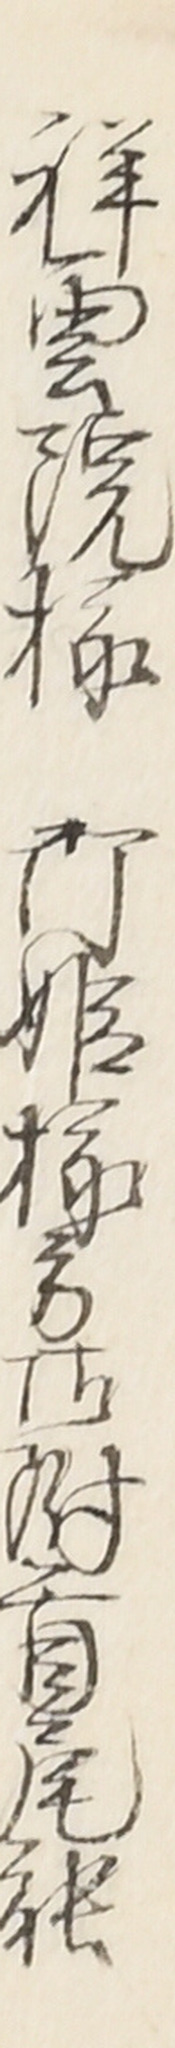祥雲院様御姫様方御附首尾能
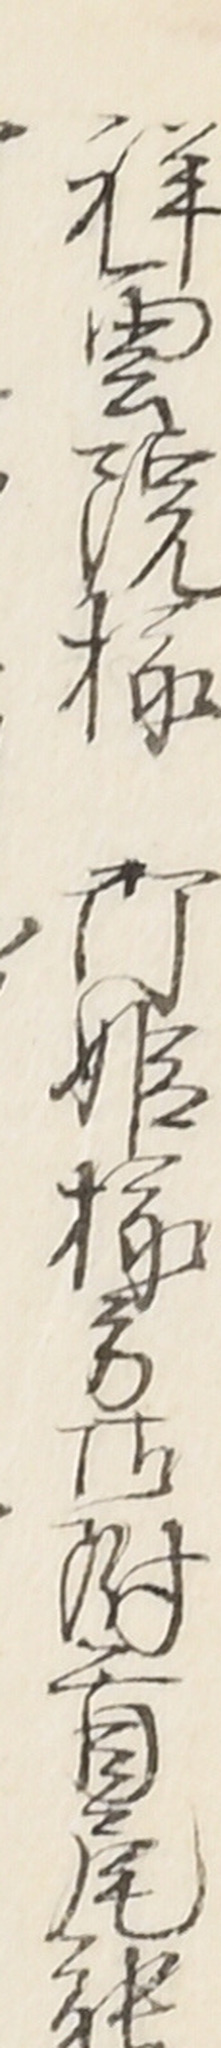祥雲院様御姫様方御附首尾能
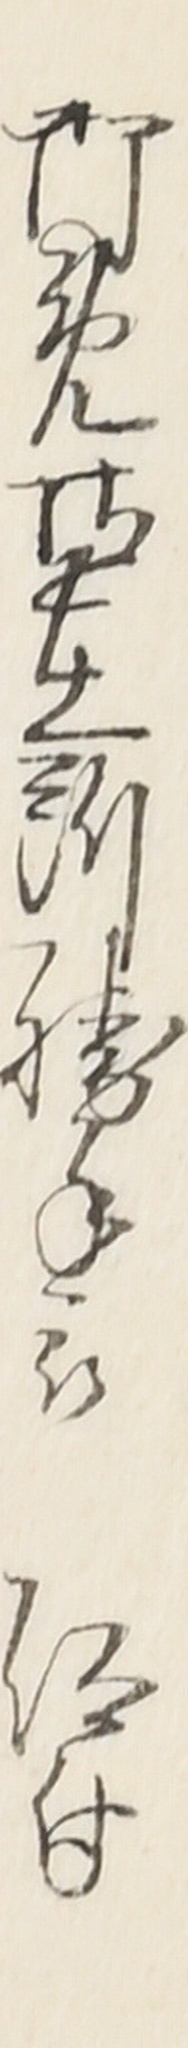御免御在所勝手被仰付
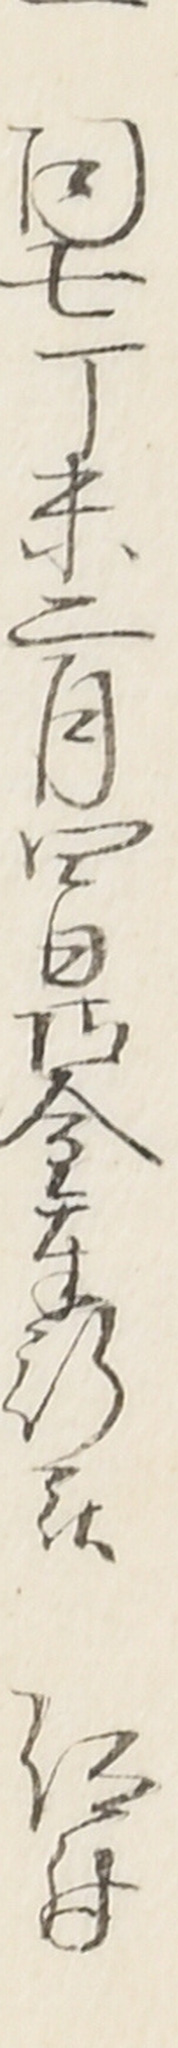一同七丁未二月四日御金奉行被仰付
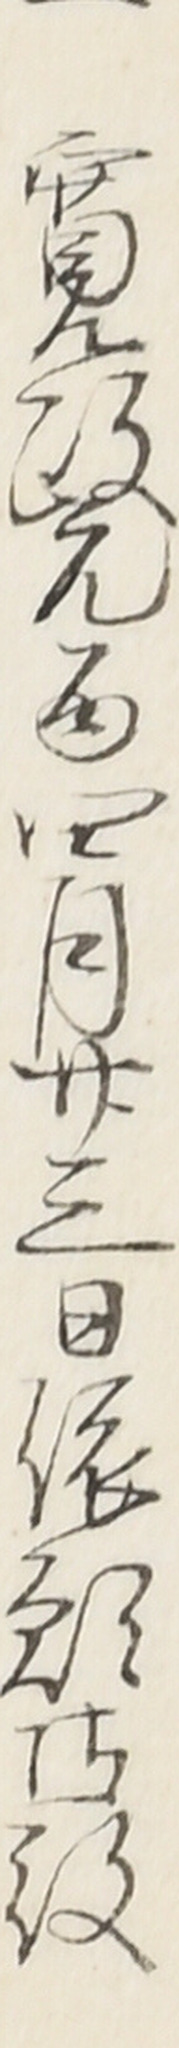一寛政元丙四月廿三日依願御役
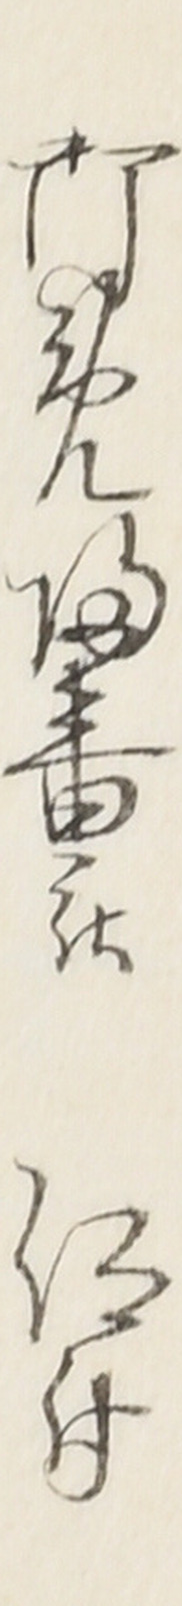御免帰番被仰付
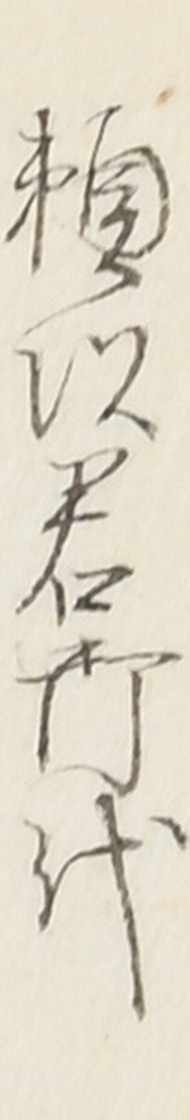頼以君御代
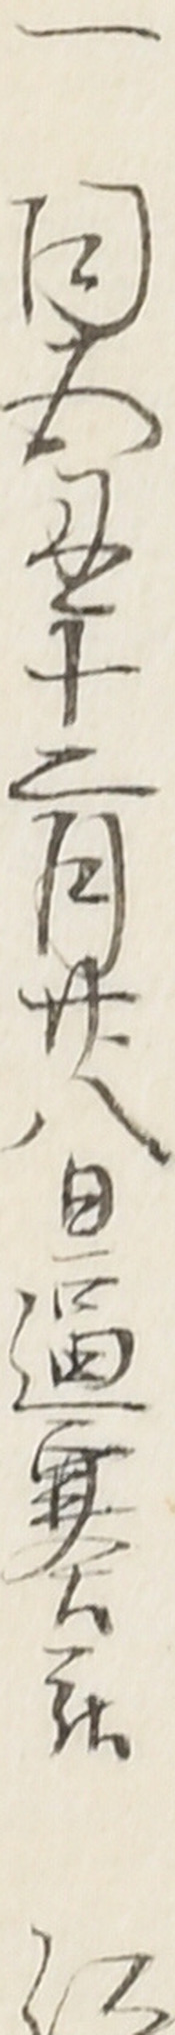一同五丑十二月廿八日逼塞被仰付
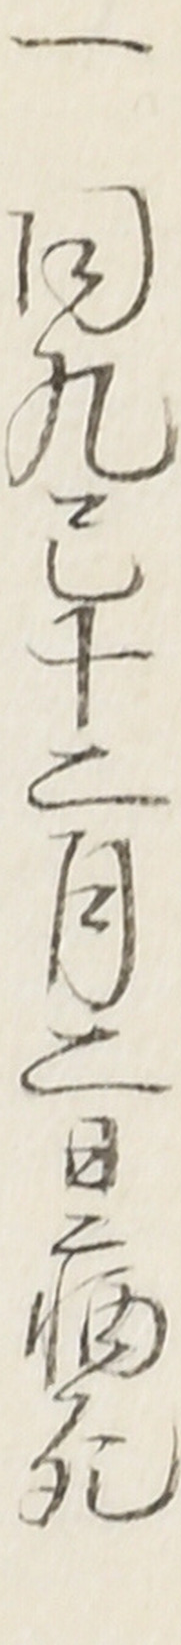一同九巳十二月二日病死
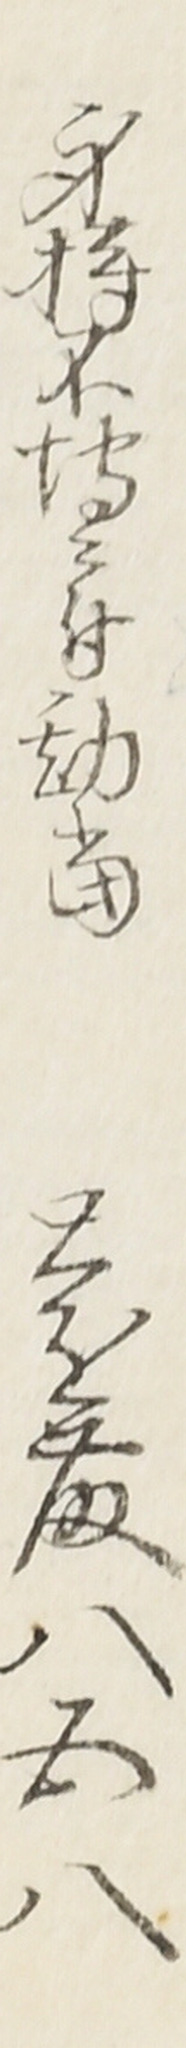身持不埒ニ付勘当遠藤八五八
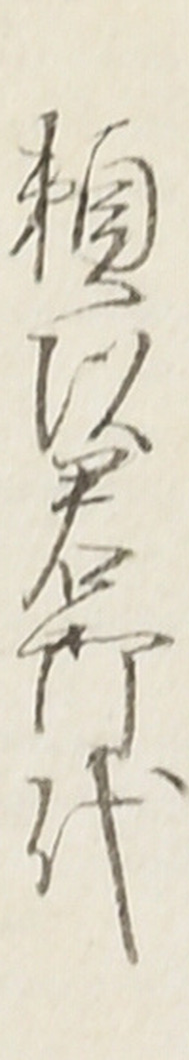頼以君御代
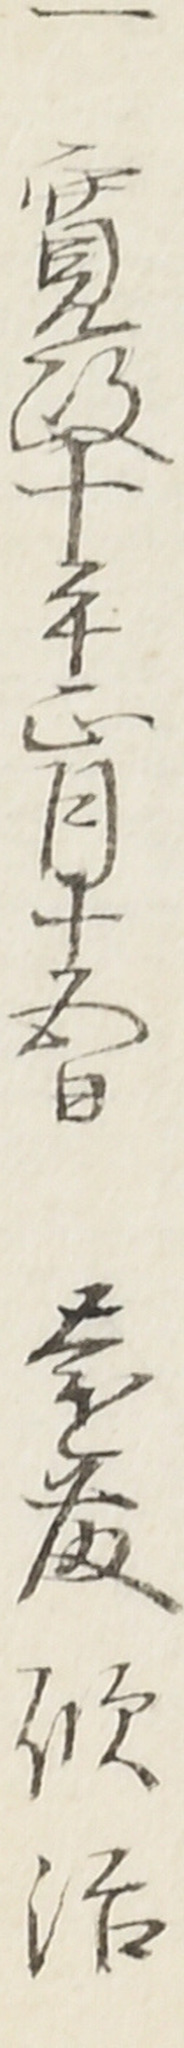一寛政十午正月十五日遠藤欣治
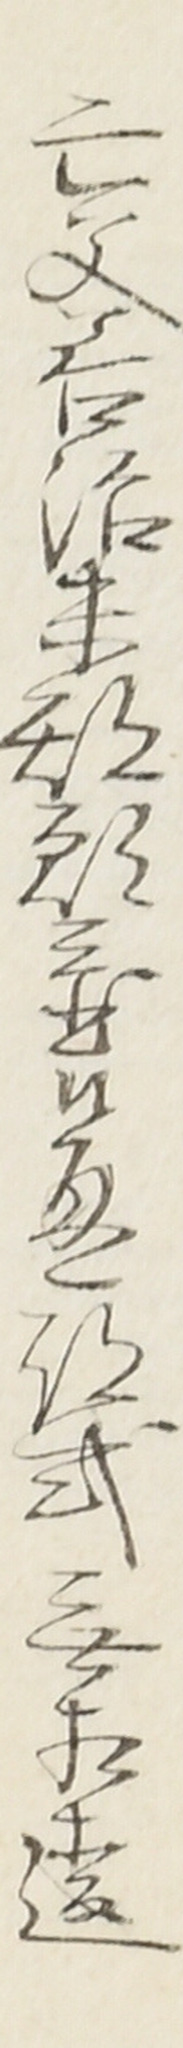亡父善治末期願置候通跡式無相違
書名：給人諸士勤仕録（七）
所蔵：伊那市立高遠町図書館・合同会社AMANE
